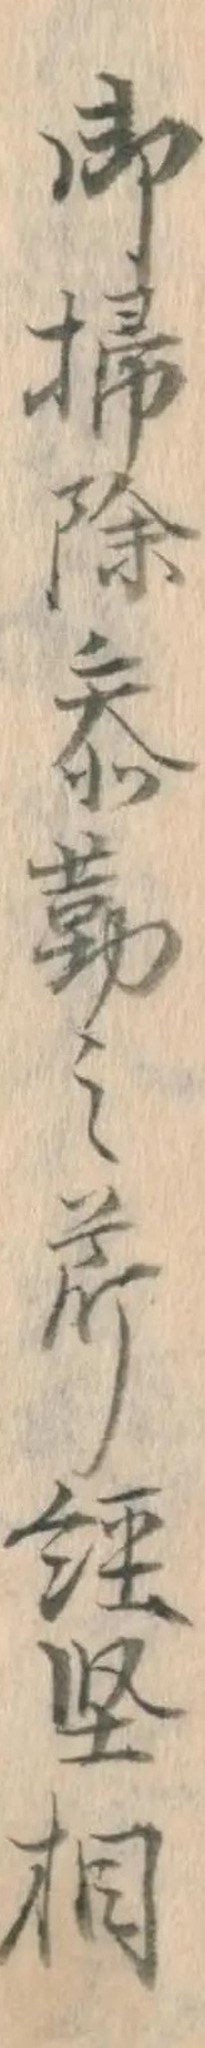御掃除参勤之節経堅相
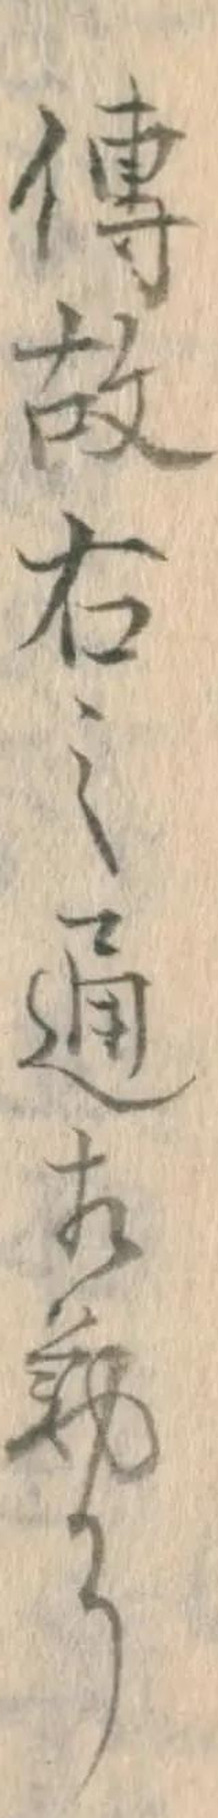傳故右之通相勤終了
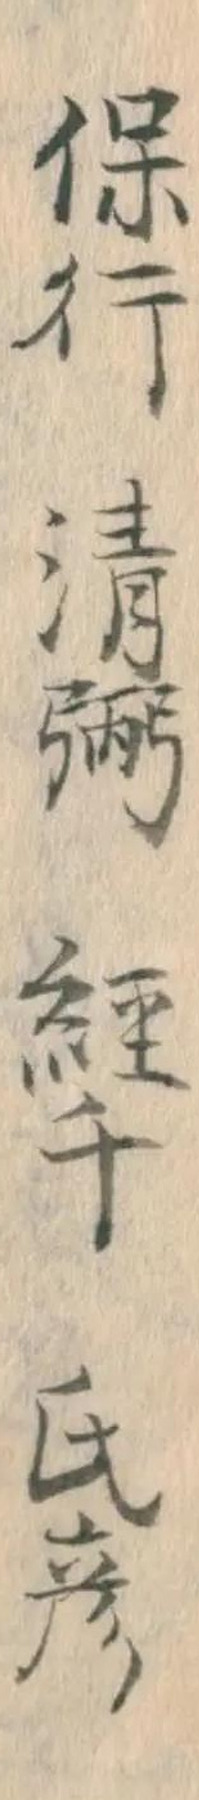保行清弼経千氏彦
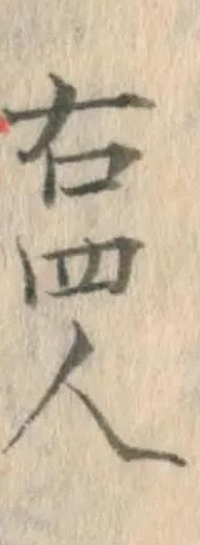右四人
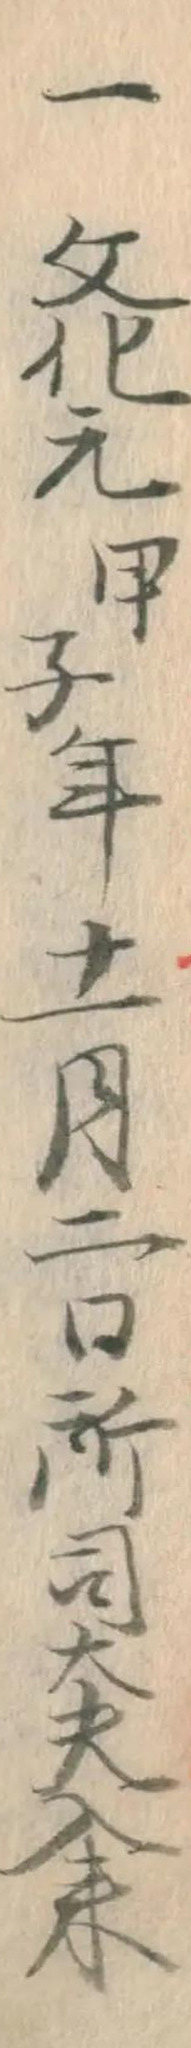一文化元甲子年十一月二日所司大夫入来

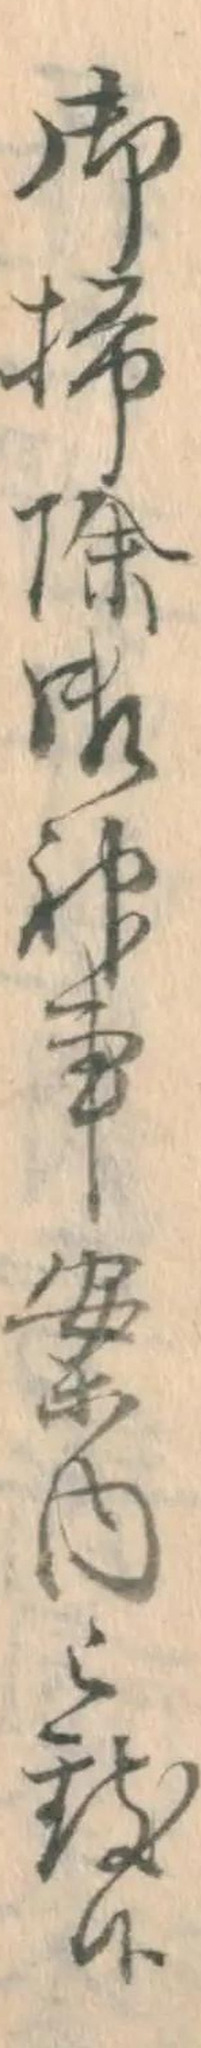御掃除御神事案内被致候
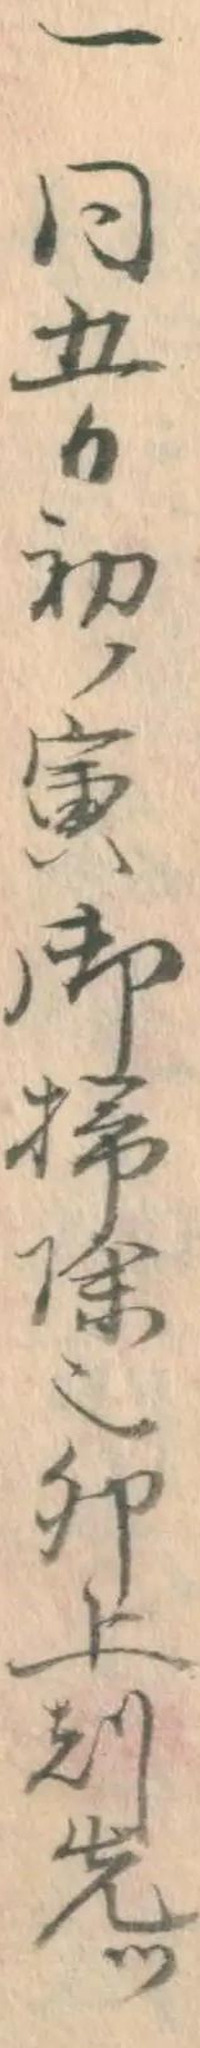一同五日初ノ寅御掃除也卯上刻先ツ
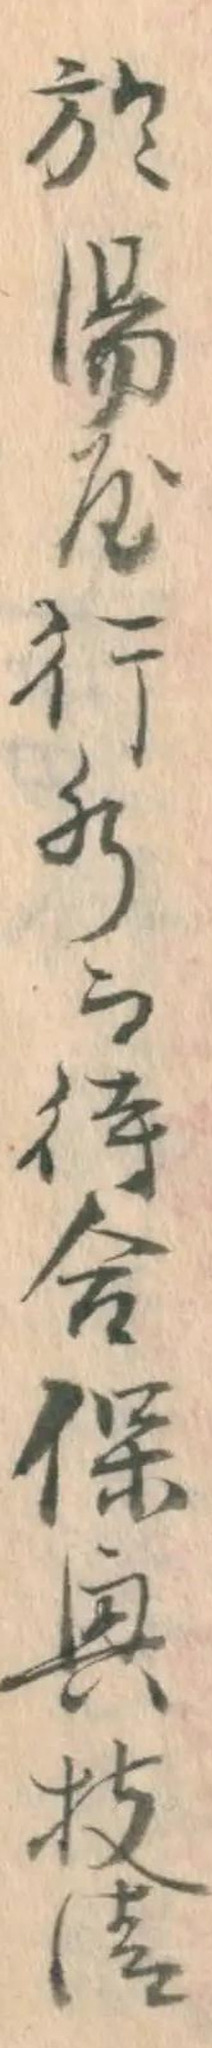於湯屋行水而待合保興技清
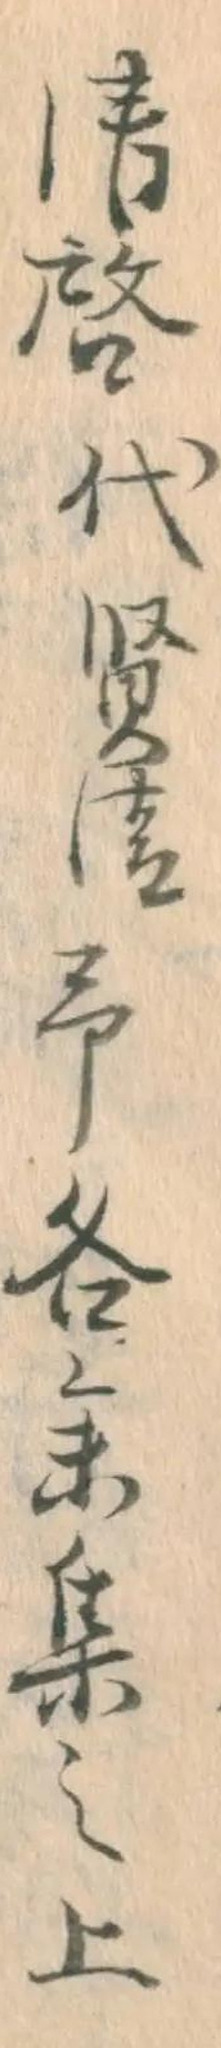清啓代賢清予各参集之上
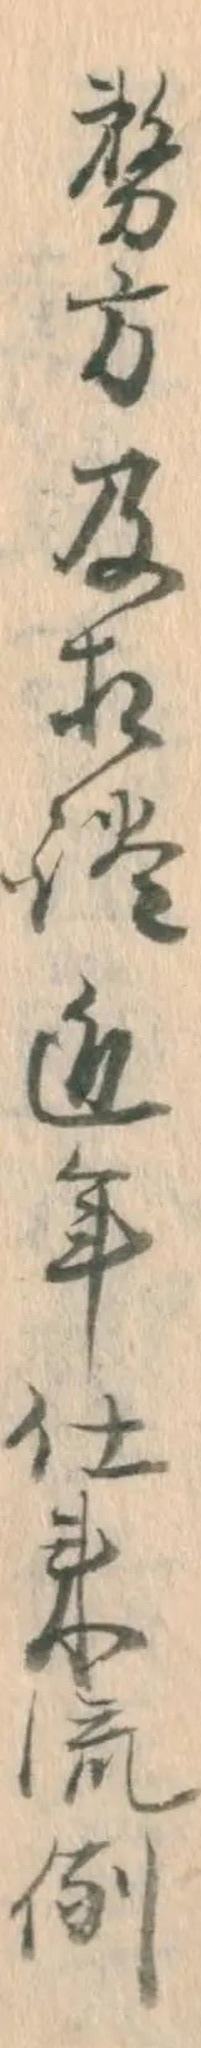務方及相談近年仕来流例
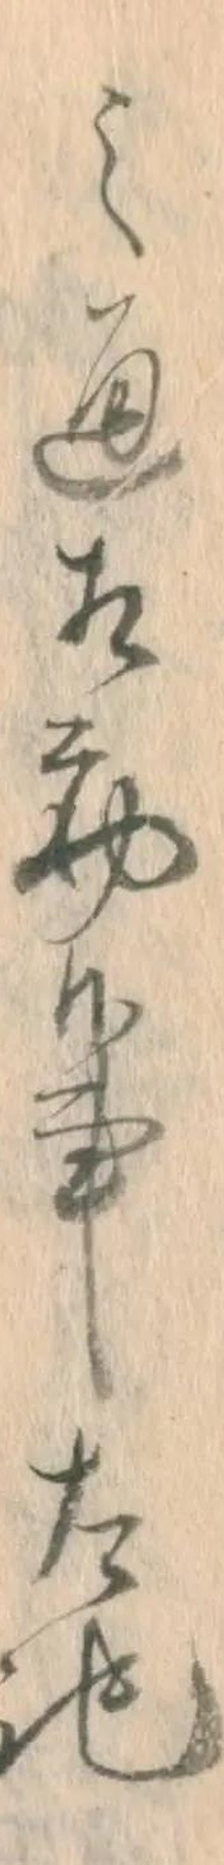之通相勤候事左記
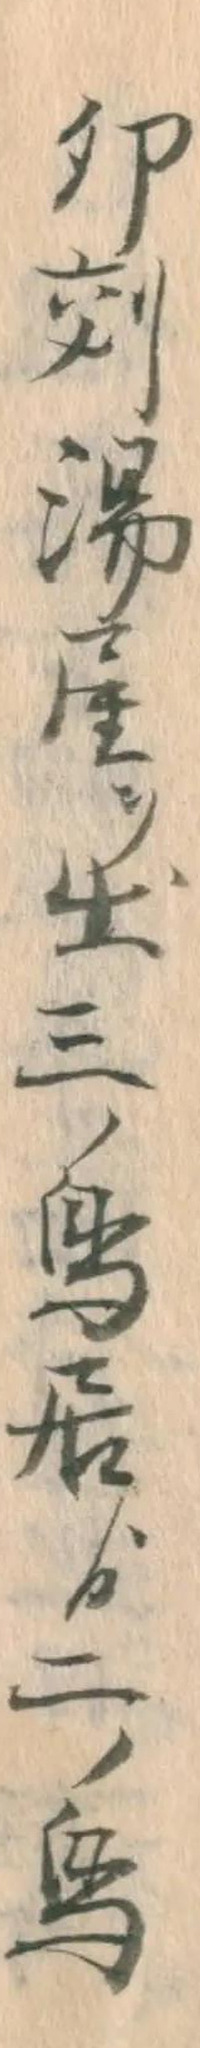一卯刻湯屋ヲ出三ノ鳥居ゟ二ノ島
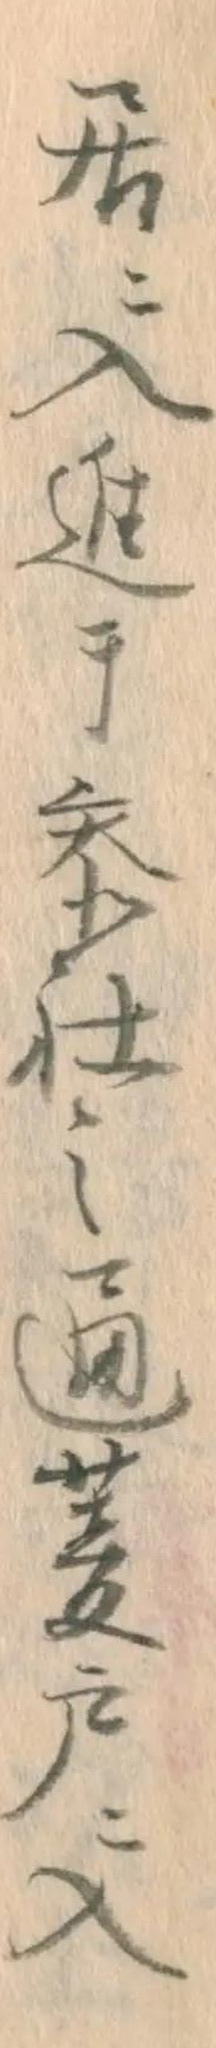居ニ入進于参社之通菱戸ニ入
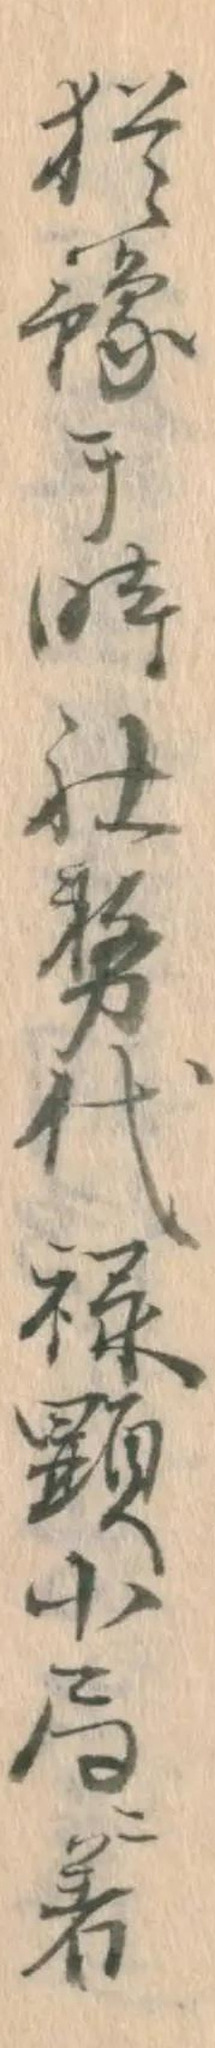猶豫于時社務代禄顕小局ニ着
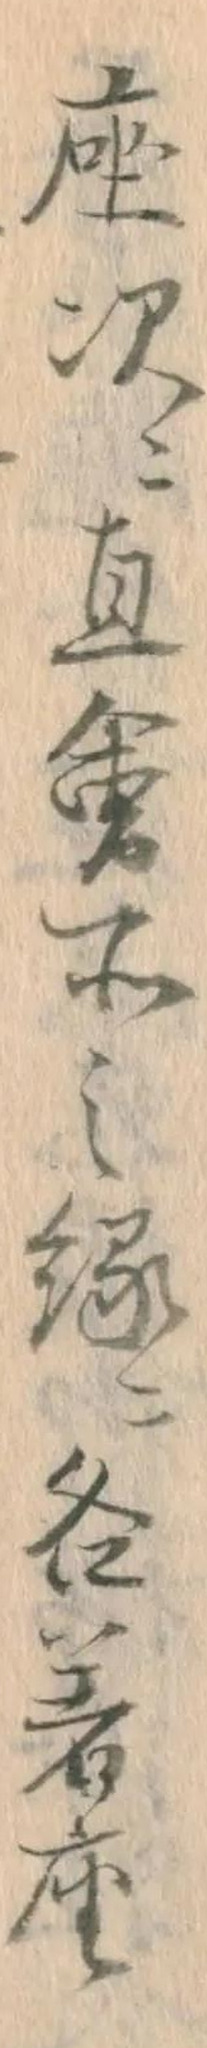座次ニ直會所之縁ニ各着座
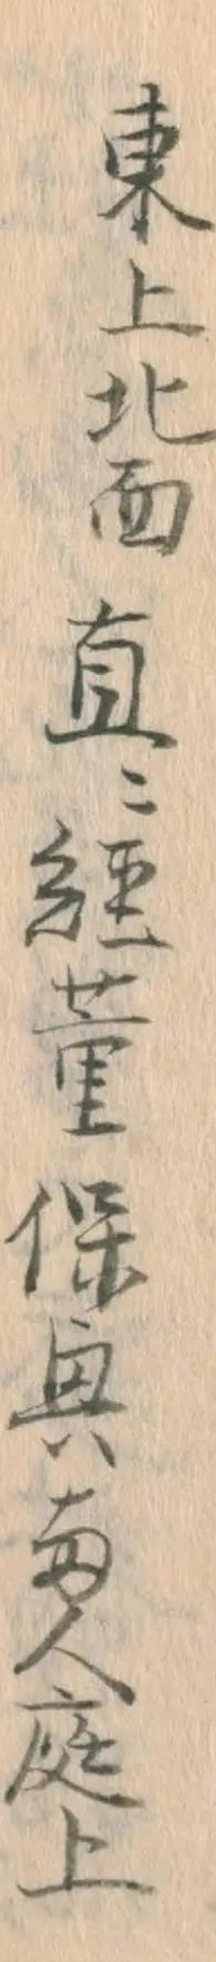東上北面直ニ経董保興両人庭上
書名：賀茂社記録. 第81冊
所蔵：国立国会図書館 National Diet Library, JAPAN
